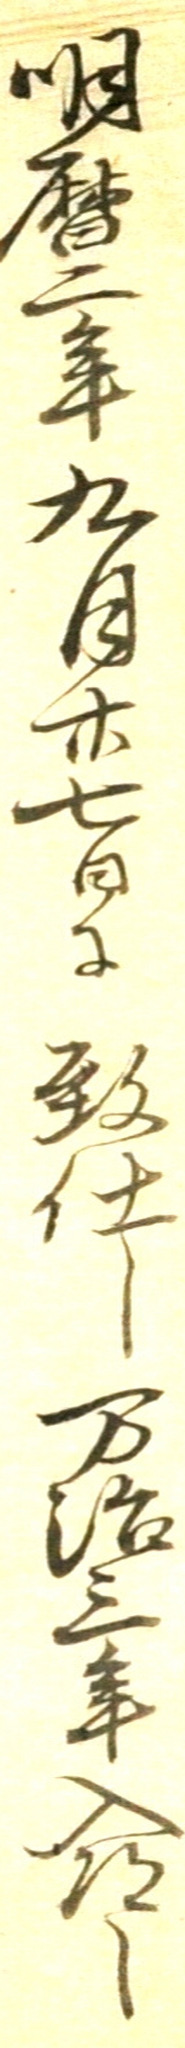明暦二年九月廿七日に致仕し万治三年入道し
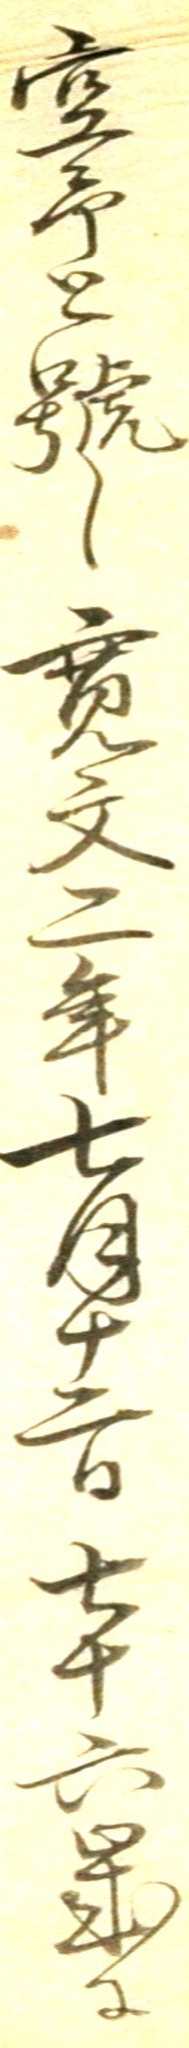空予と号し寛文二年七月十二日七十六歳に
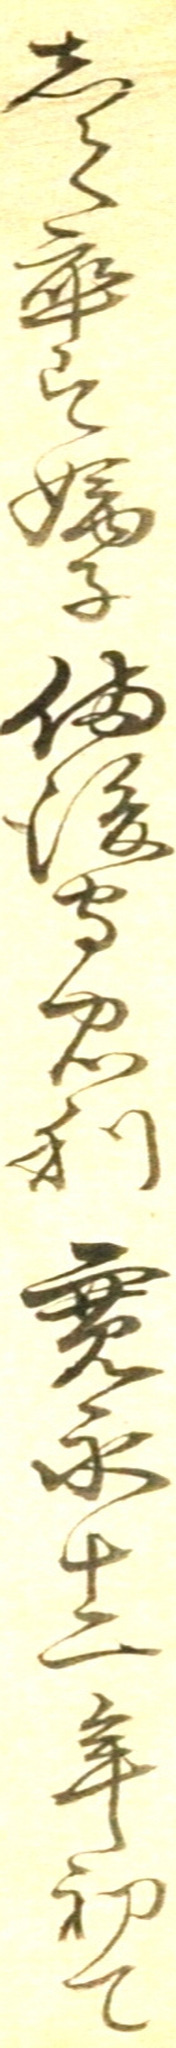して卒す嫡子備後守忠利寛永十二年初て
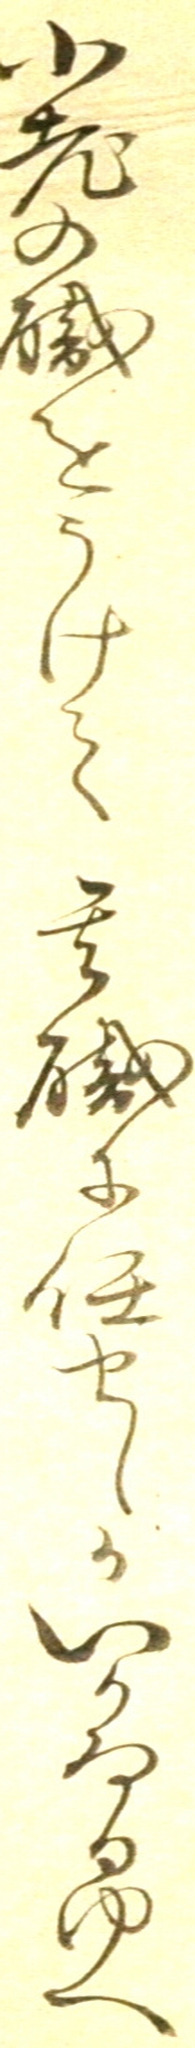小老の職をうけて其職に任せしかいかなるゆへ
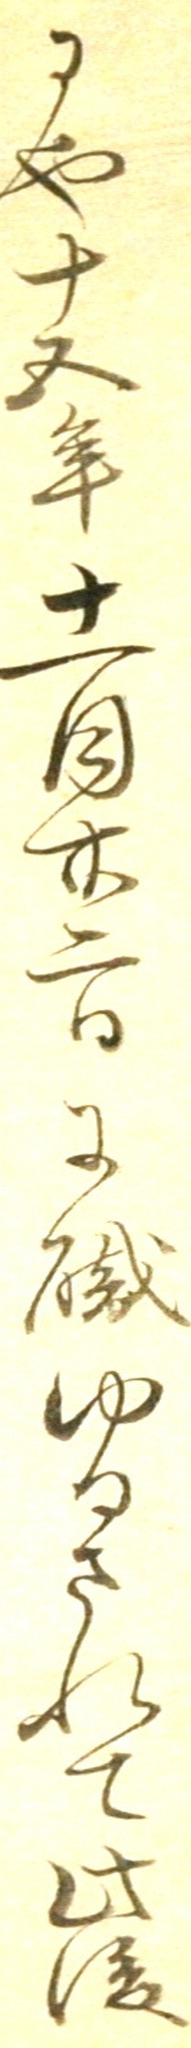にや十五年十一月廿二日に職ゆるされて此後
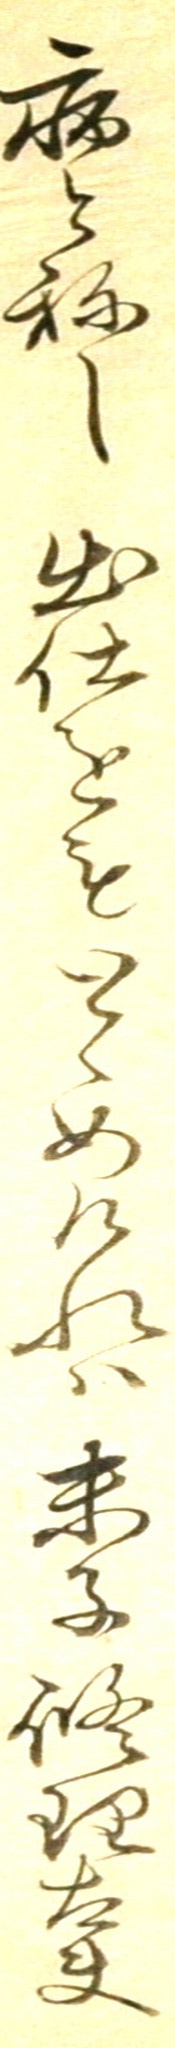病と称し出仕をもとゝめけれは末子修理太夫
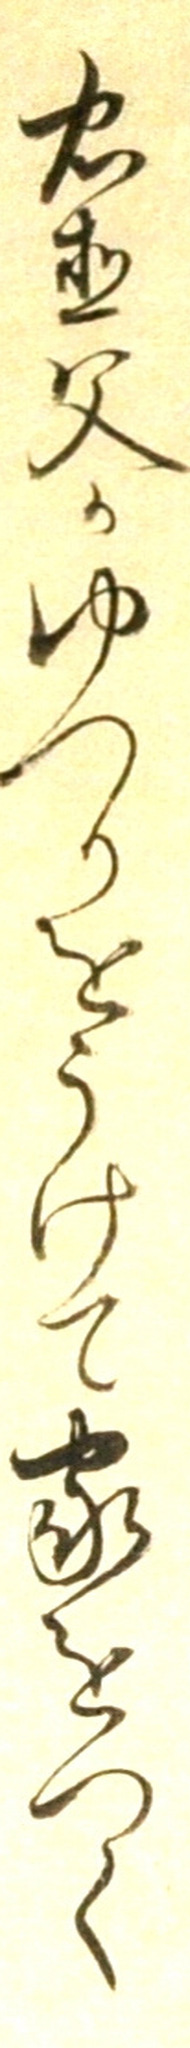忠直父かゆつりをうけて家をつく
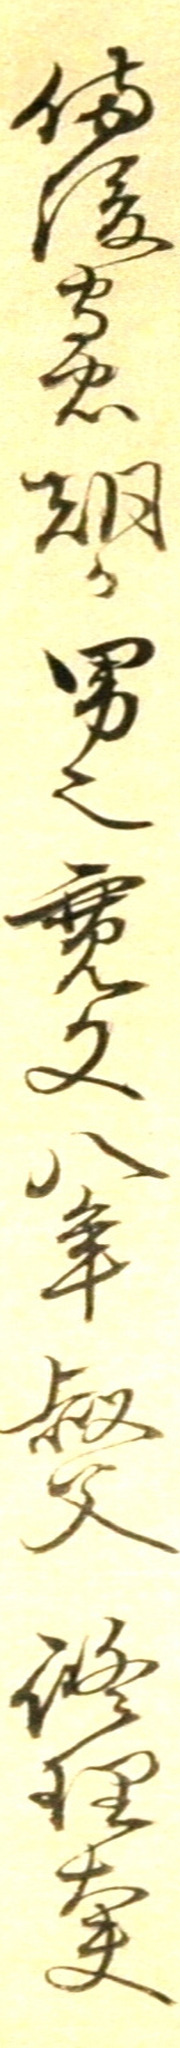備後守忠朝か男也寛文八年叔父修理大夫

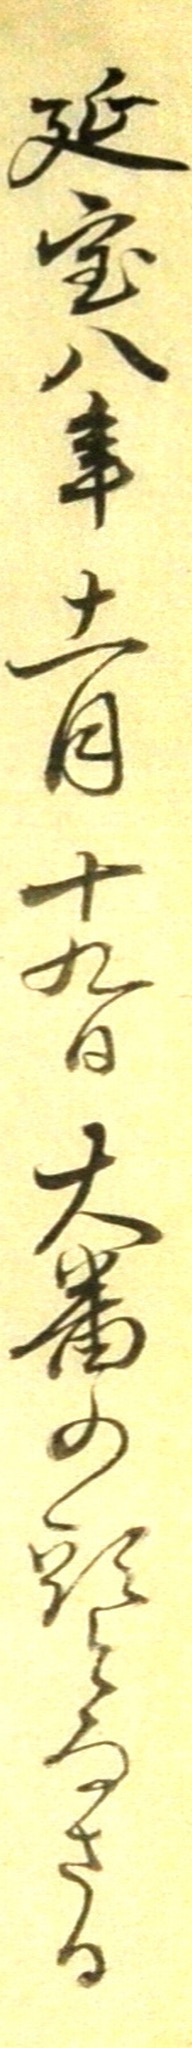延宝八年十一月十九日大番の頭となさる
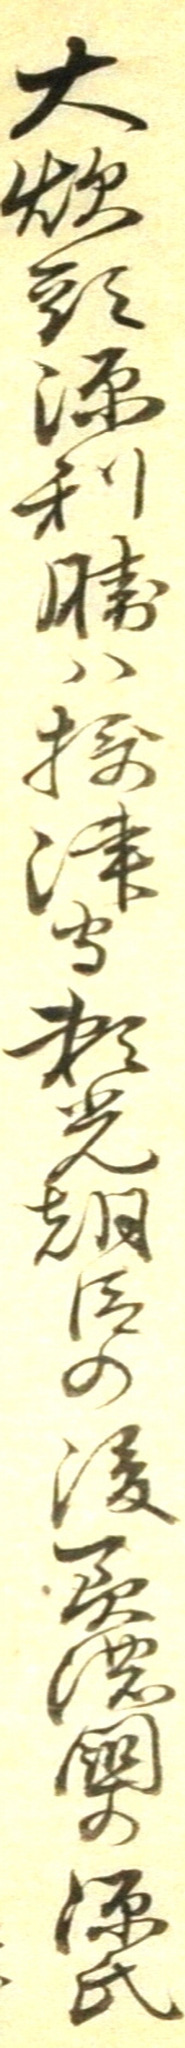大炊頭源利勝は摂津守頼光朝臣の後美濃国の源氏
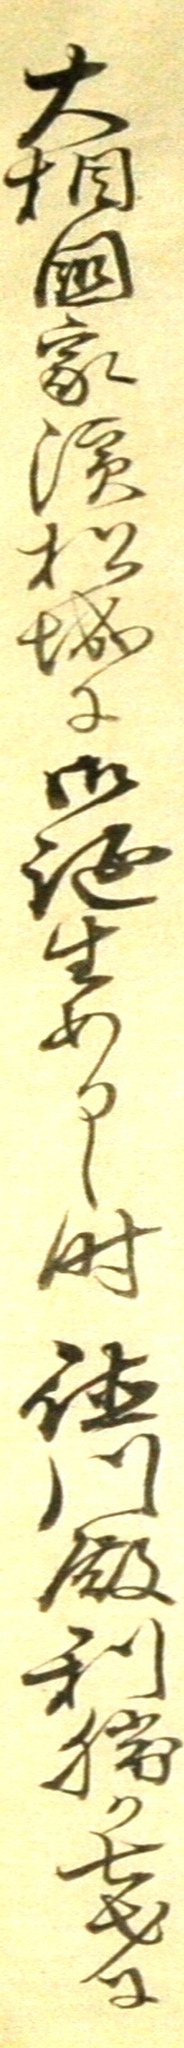大相国家浜松城に御誕生ありし時徳川殿利勝か七歳に
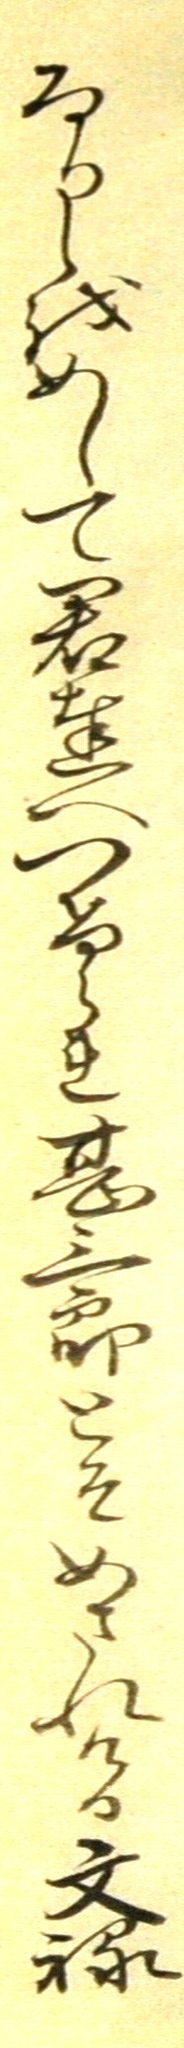なりしをめして君達へつけられ甚三郎とそめされける文禄

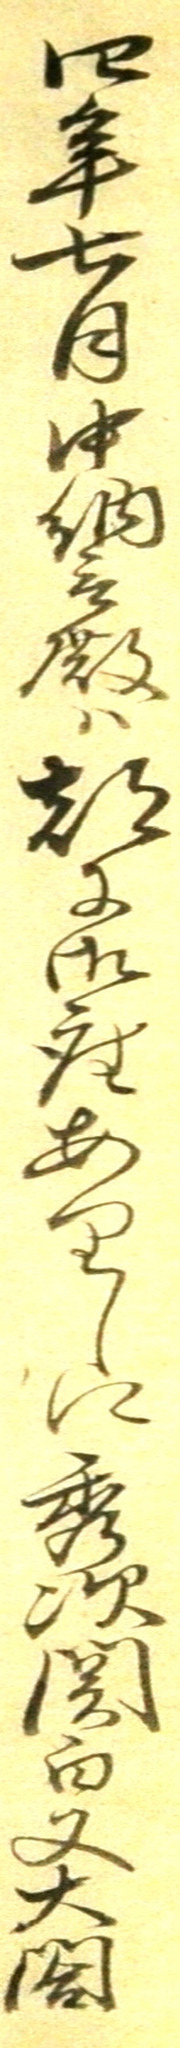四年七月中納言殿は都に御座ありしに秀次関白又太閤
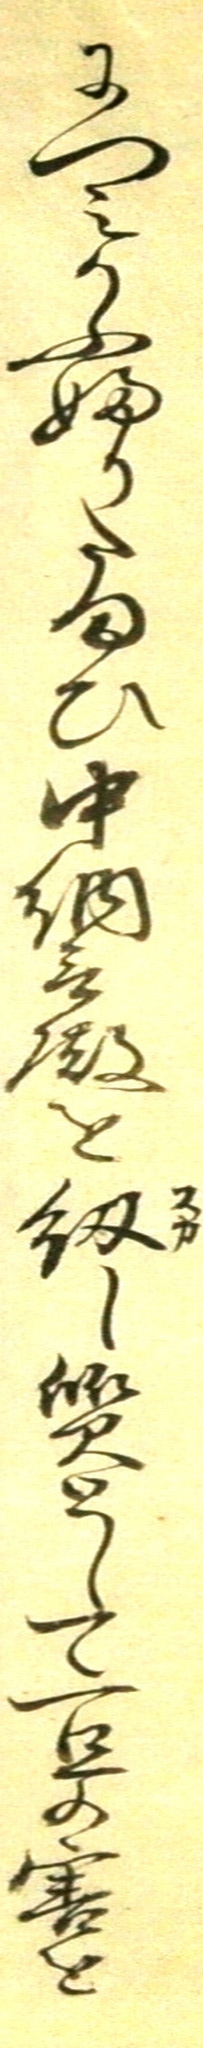につみかふふりたまひ中納言殿を紉し質として一旦の害を
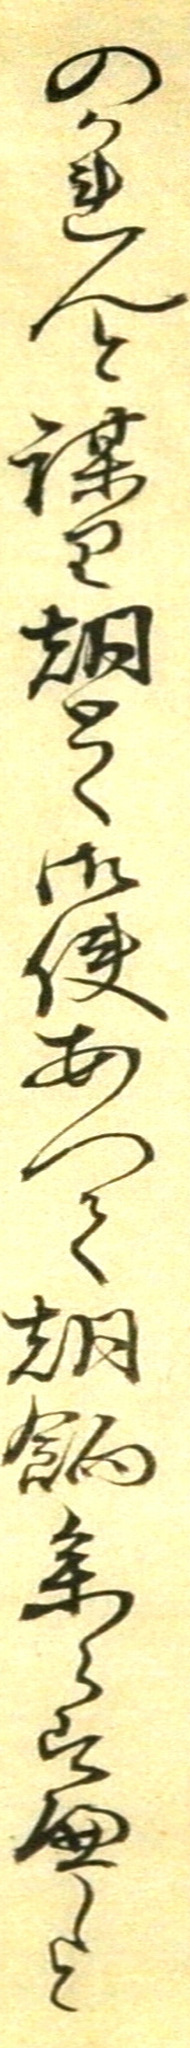のかれんと謀り朝とく御使あつて朝餉参らすへしと
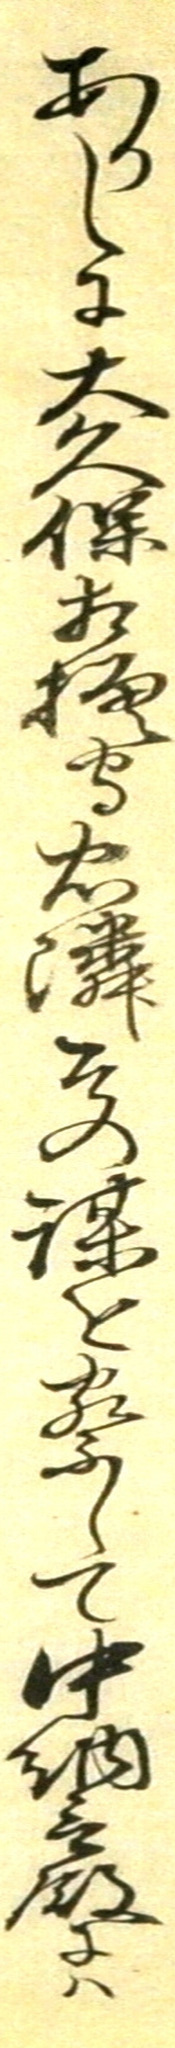ありしに大久保相模守忠隣その謀を察して中納言殿には
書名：藩翰譜（五）
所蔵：伊那市立高遠町図書館・合同会社AMANE
